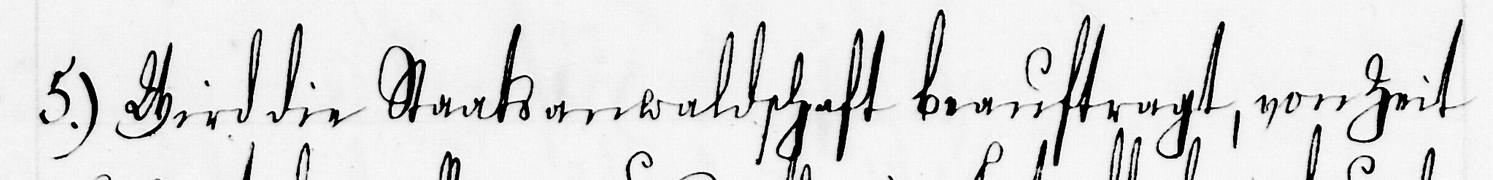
5.) Wird die Staatsanwaldschaft beauftragt, von Zeit
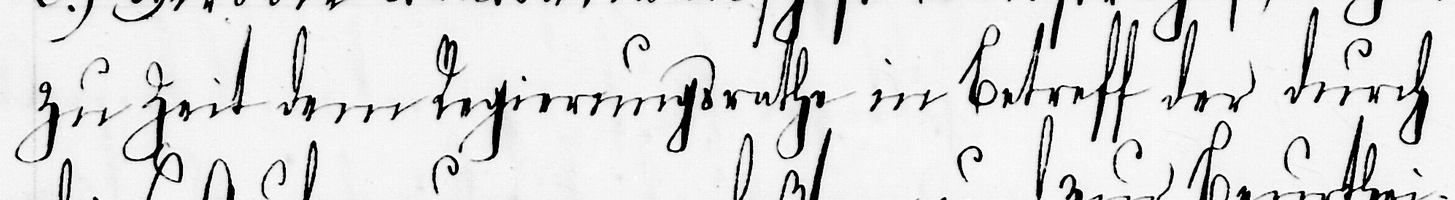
zu Zeit dem Regierungsrathe in Betreff der durch
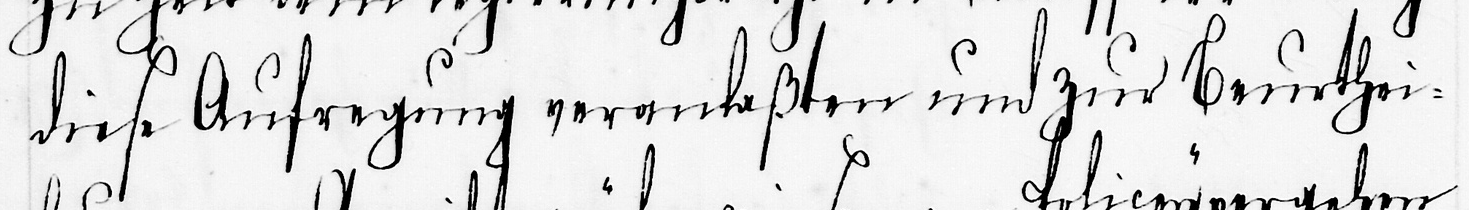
diese Aufregung veranlaßten und zur Beurthei¬
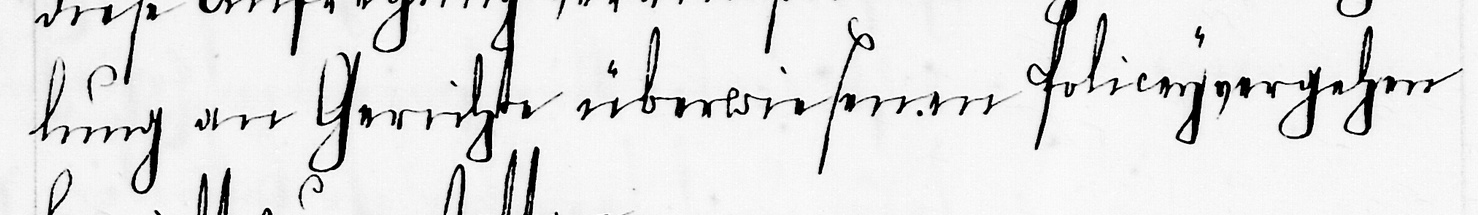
lung an Gerichte überwiesenen Policeyvergehen
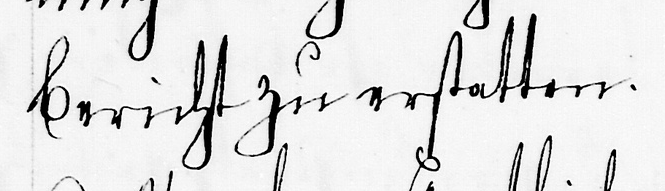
Bericht zu erstatten.
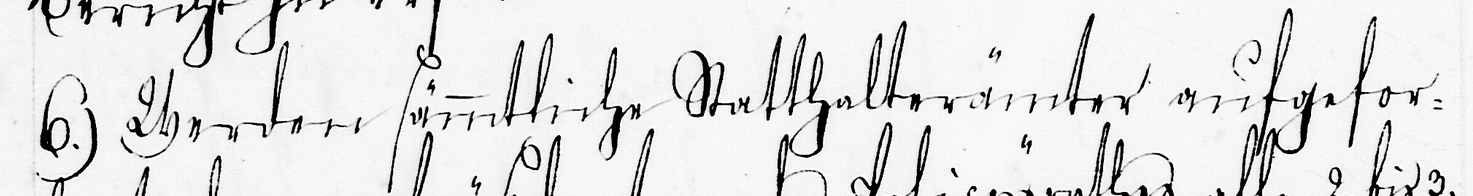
6.) Werden sämmtliche Statthalterämter aufgefor¬
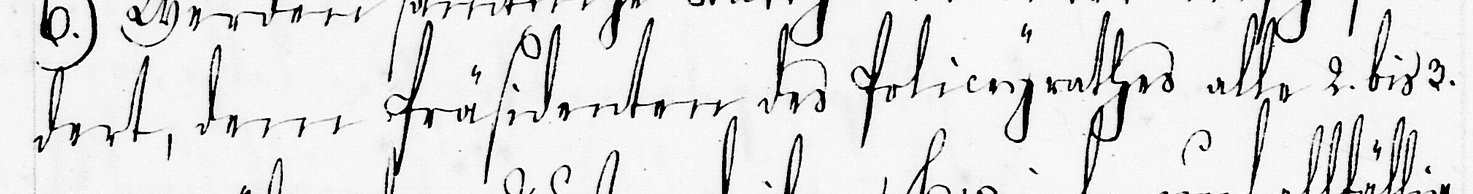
dert, dem Präsidenten des Policeyrathes alle 2.
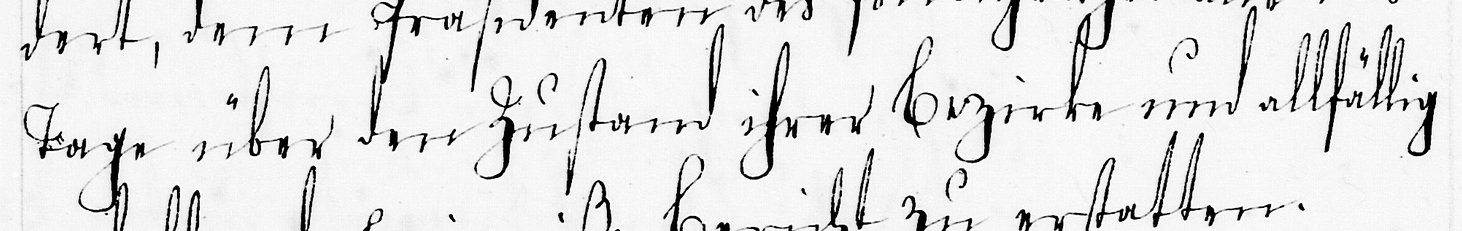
Tage über den Zustand ihrer Bezirke und all¬
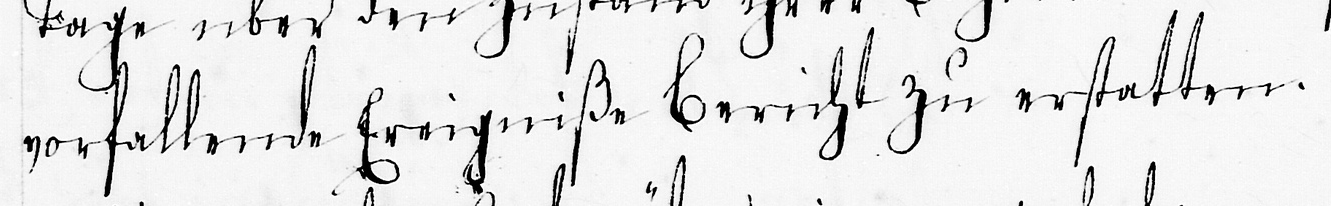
vorfallende Ereigniße Bericht zu erstatten.
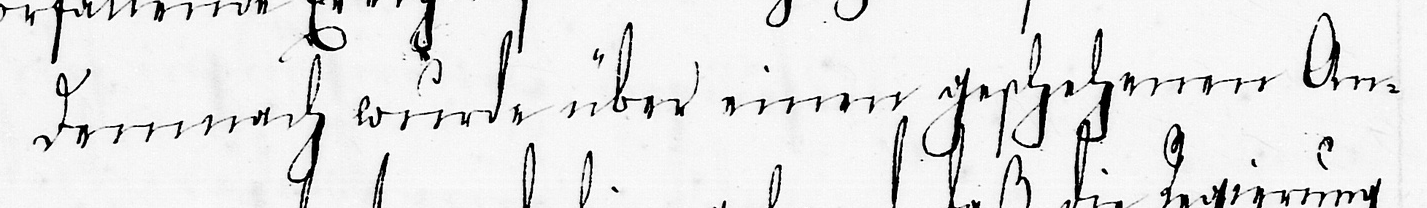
Demnach wurde über einen geschehenen An¬
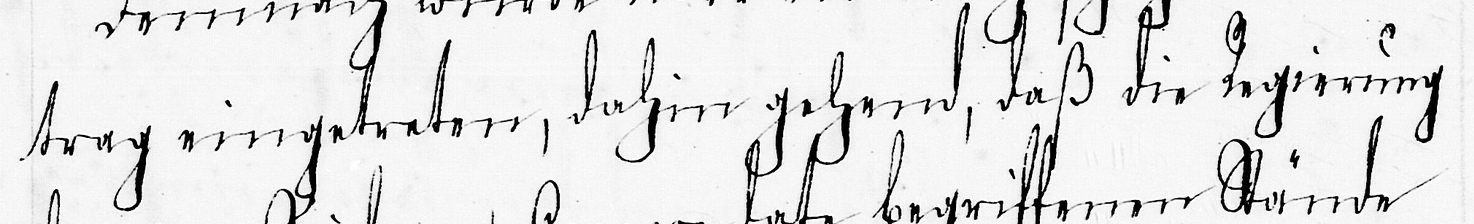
trag eingetreten, dahin gehend, daß die Regierung
